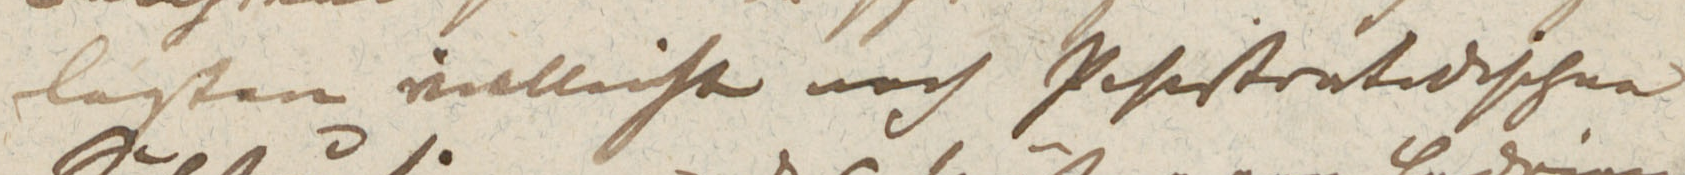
legten vielleicht noch Pisistratidischen
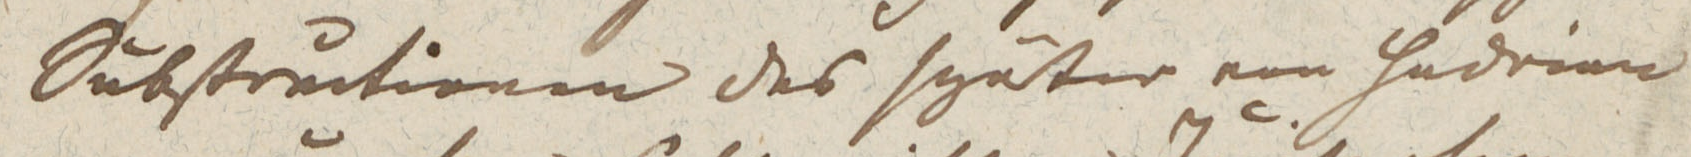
Substructionen des später von Hadrian
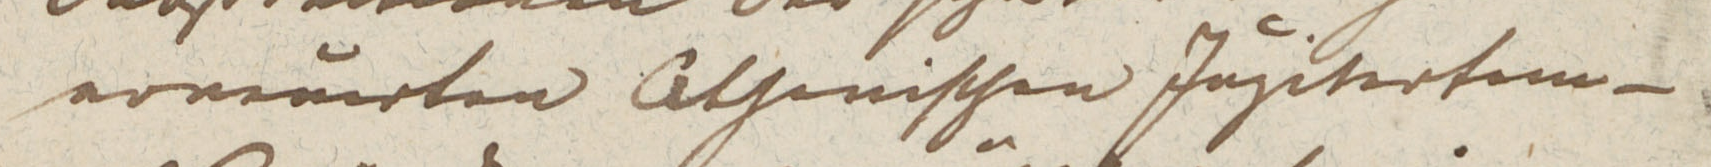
erneuerten Athenischen Jupitertem-
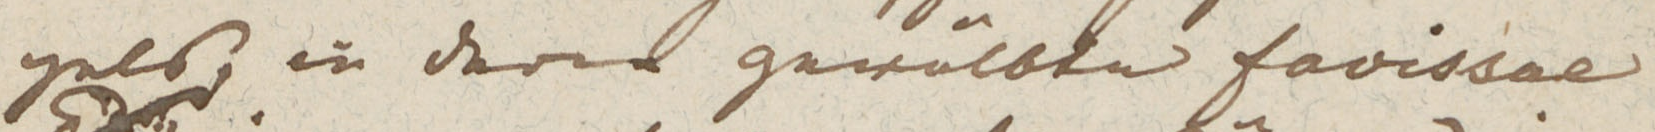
pels, in deren gewölbte favissae
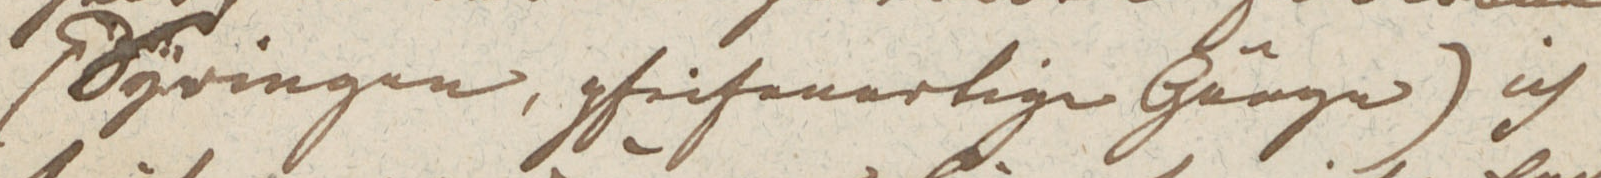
(Syringen, pfeifenartige Gänge) ich
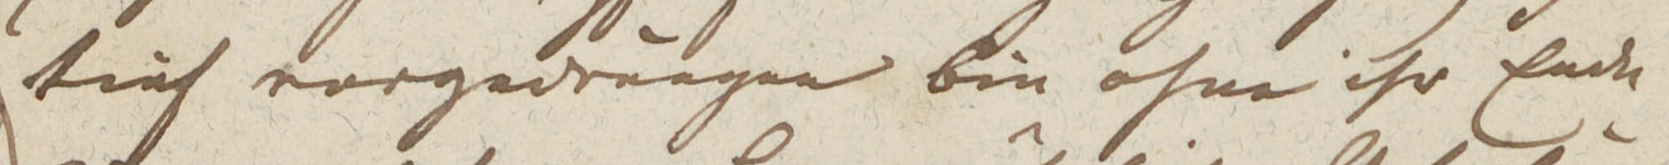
tief vorgedrungen bin ohne ihr Ende
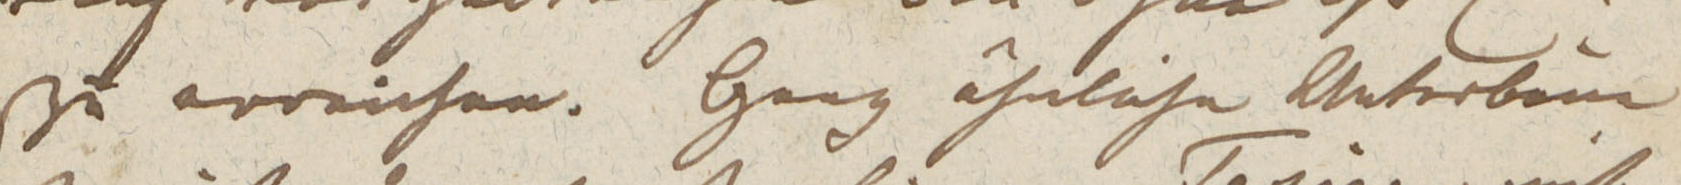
zu erreichen. Ganz ähnliche Unterbaue
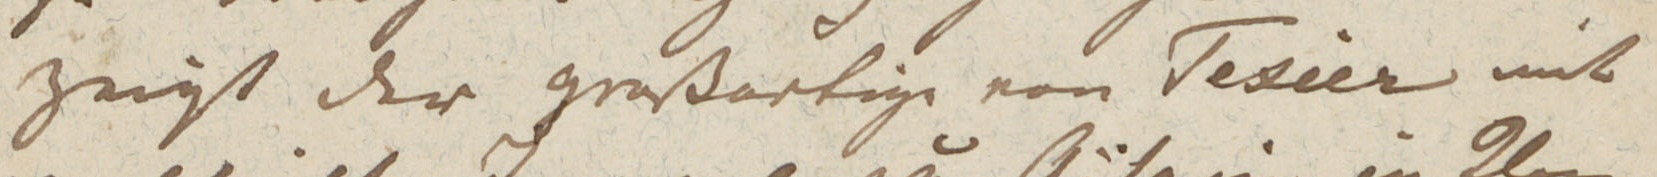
zeigt der grossartige von Texier mit
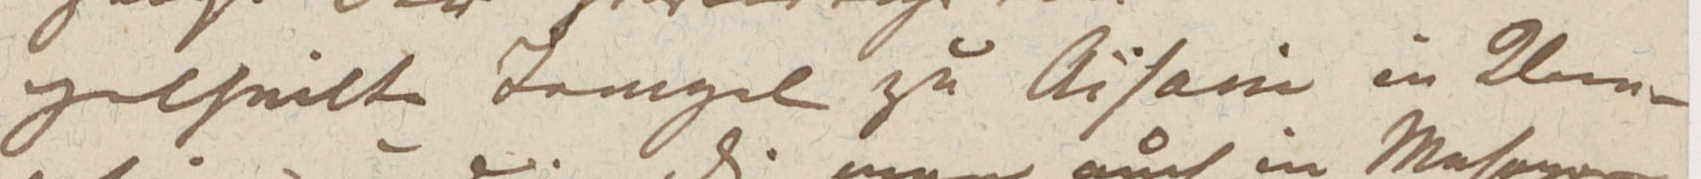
getheilte Tempel zu Aïsani in Klein-
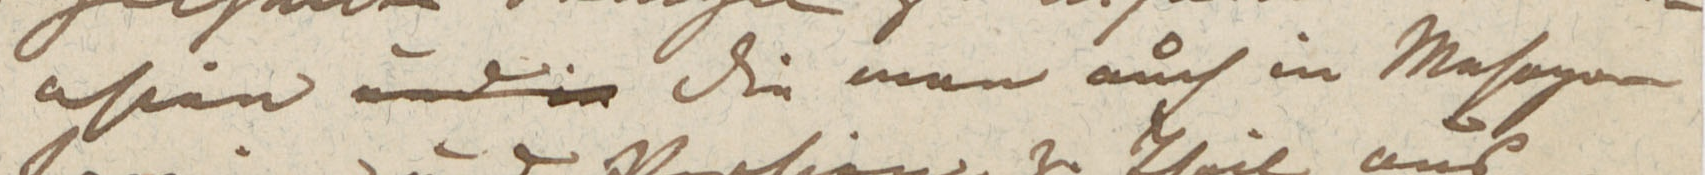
asien und in die man auch in Mesopo-
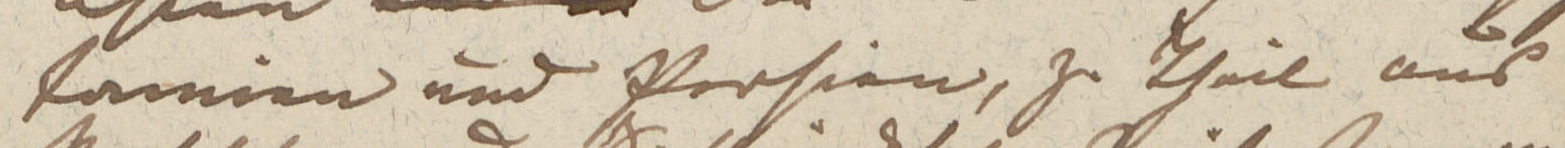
tamien und Persien, zu Theil aus
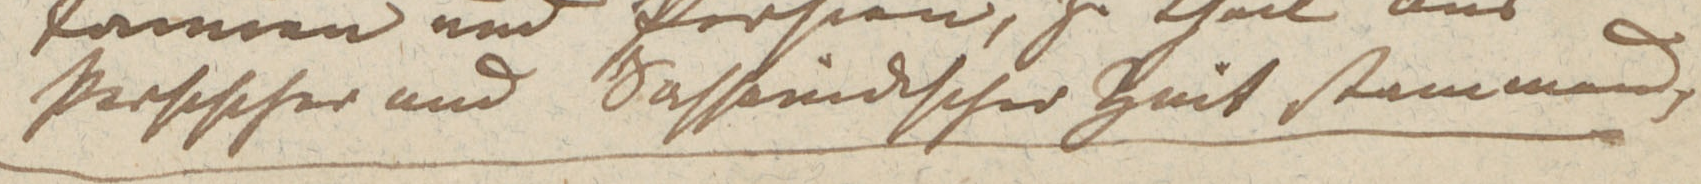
Persischer und Sassanidischer Zeit stammend,
